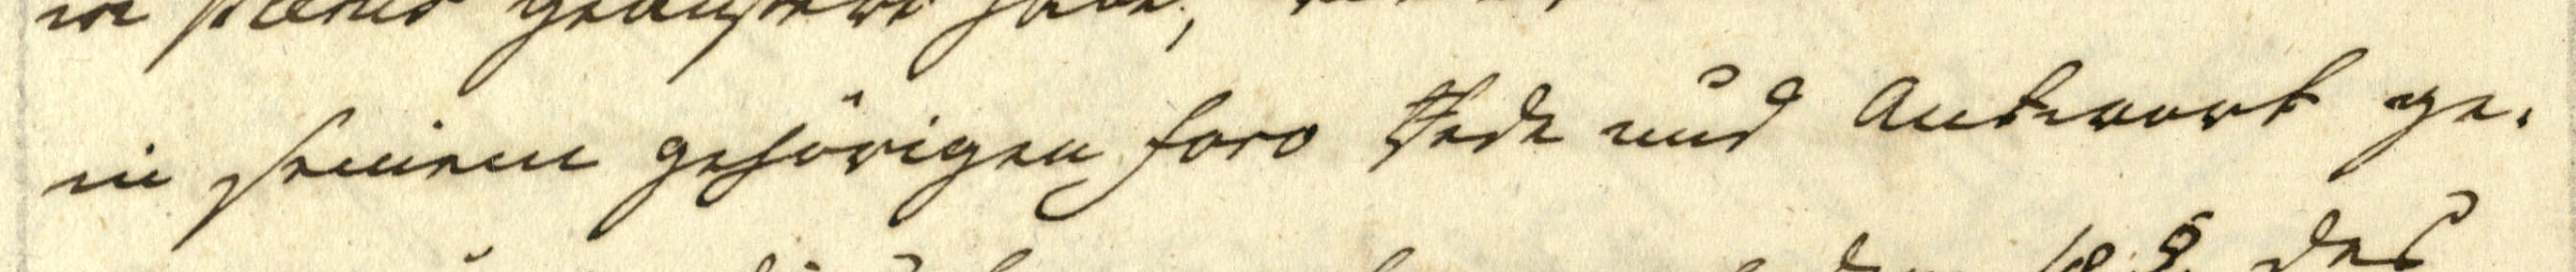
in seinem gehörigen Foro Rede und Antwort ge¬
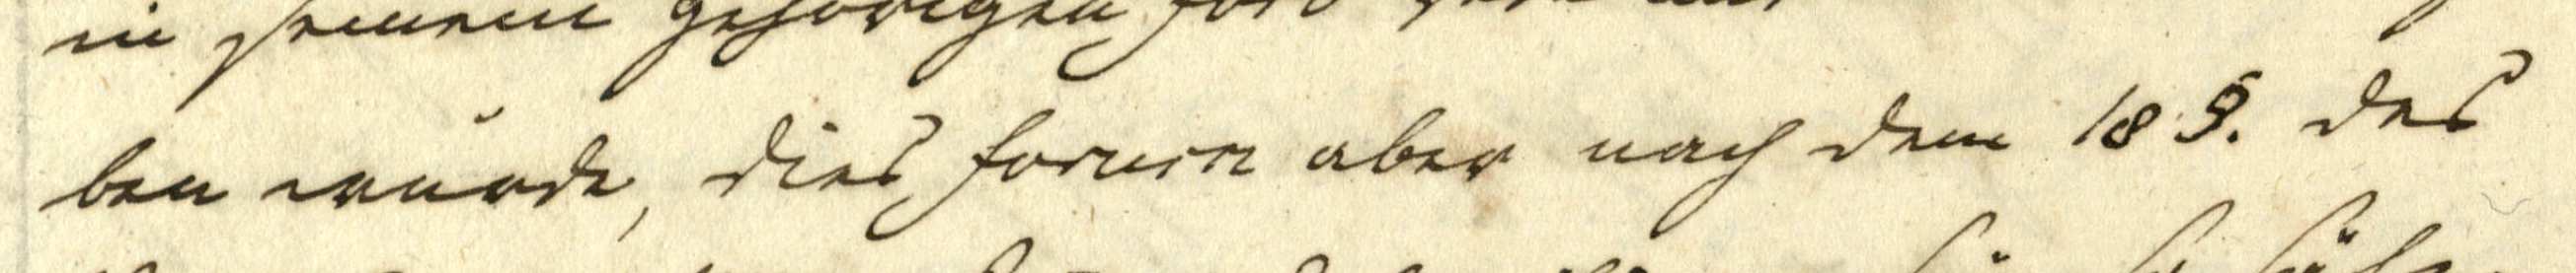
ben würde, dies Forum aber nach dem 18 §. des
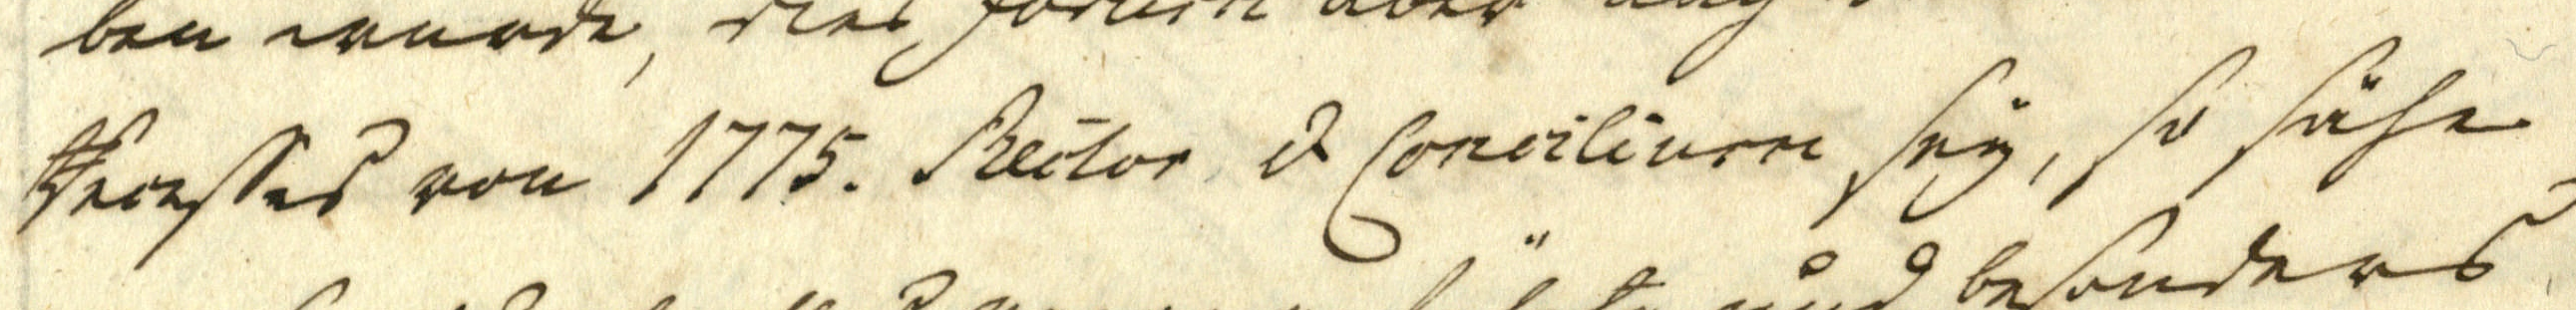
Recesses von 1775. Rector et Concilium seÿ, so sähe
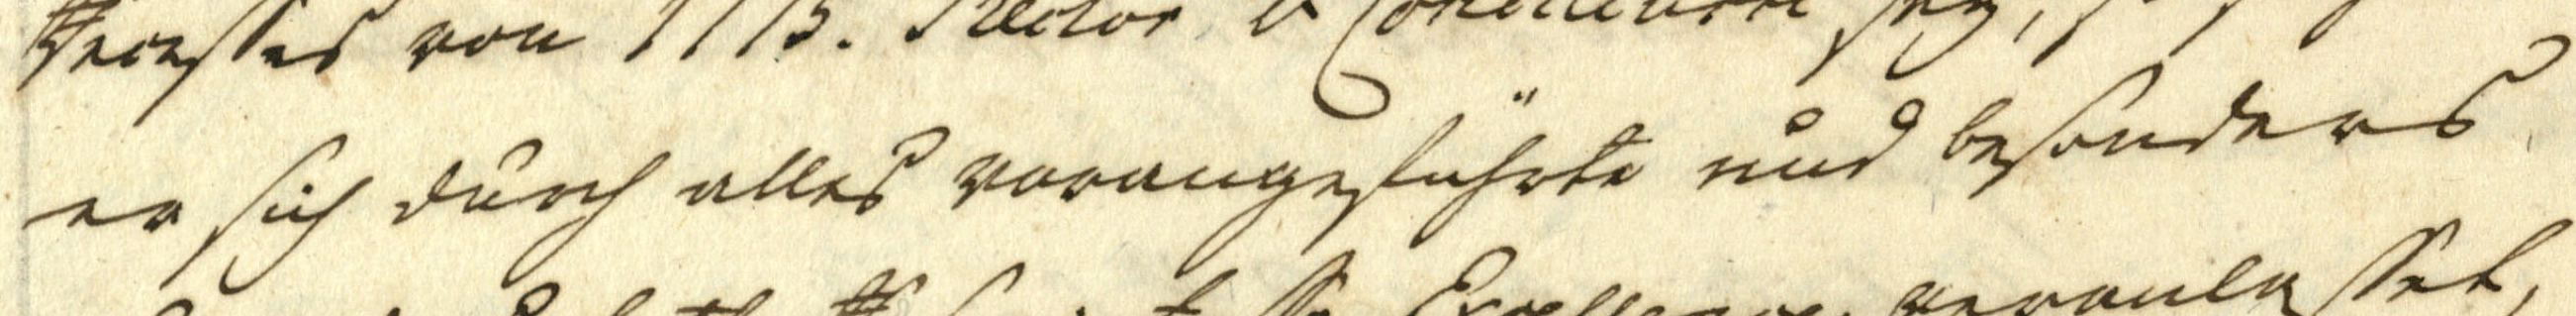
er sich durch alles vorangeführte und besonders
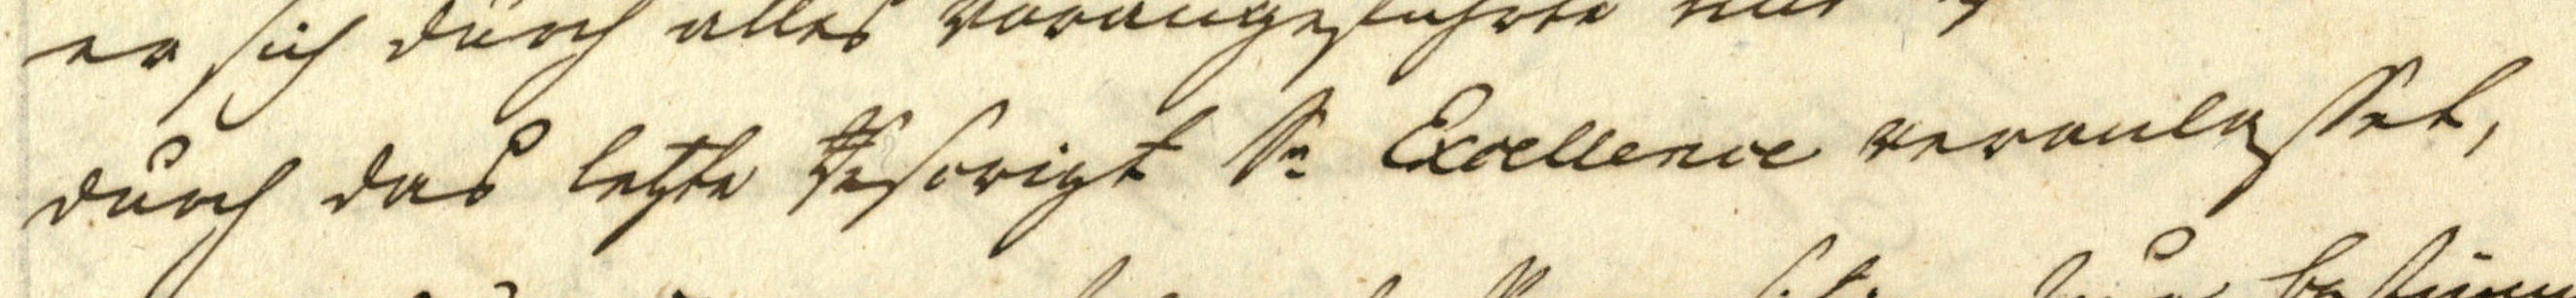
durch das letzte Rescript Sr Excellence veranlasset,
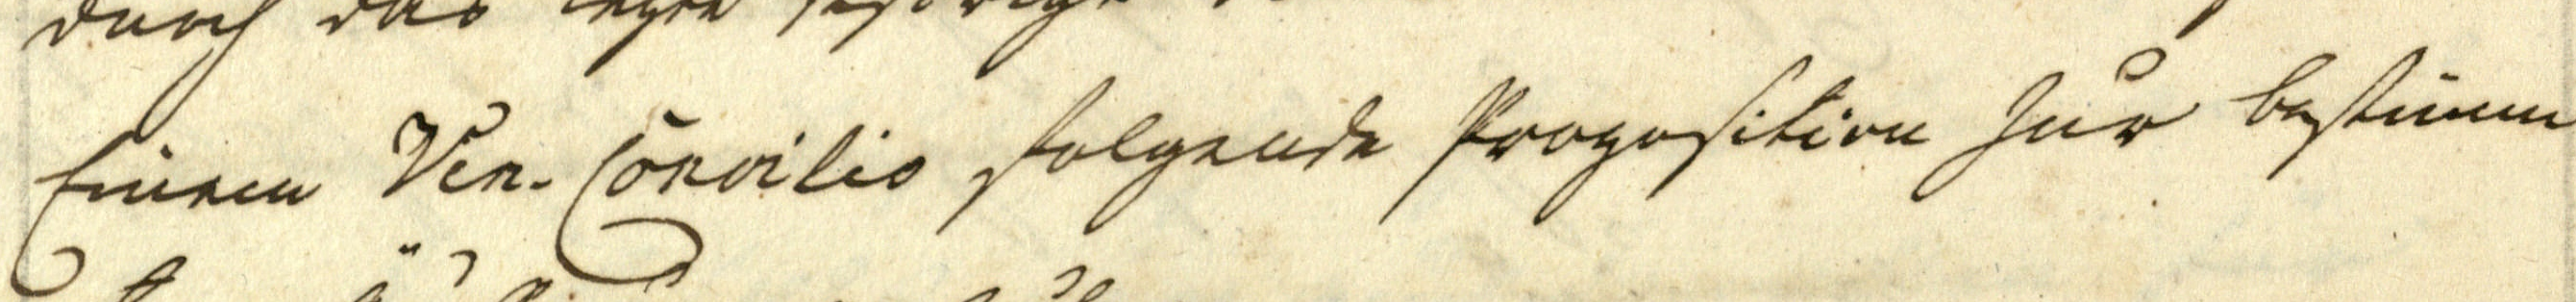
Einem Ven. Concilio folgende Proposition zur bestimm¬
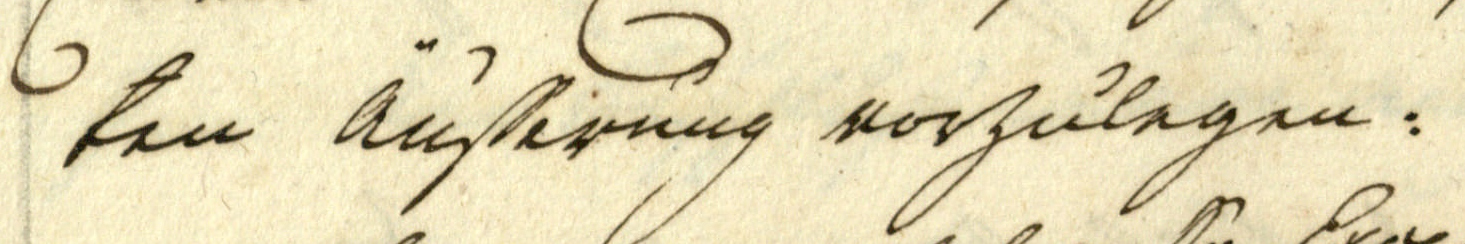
ten Äusserung vorzulegen:
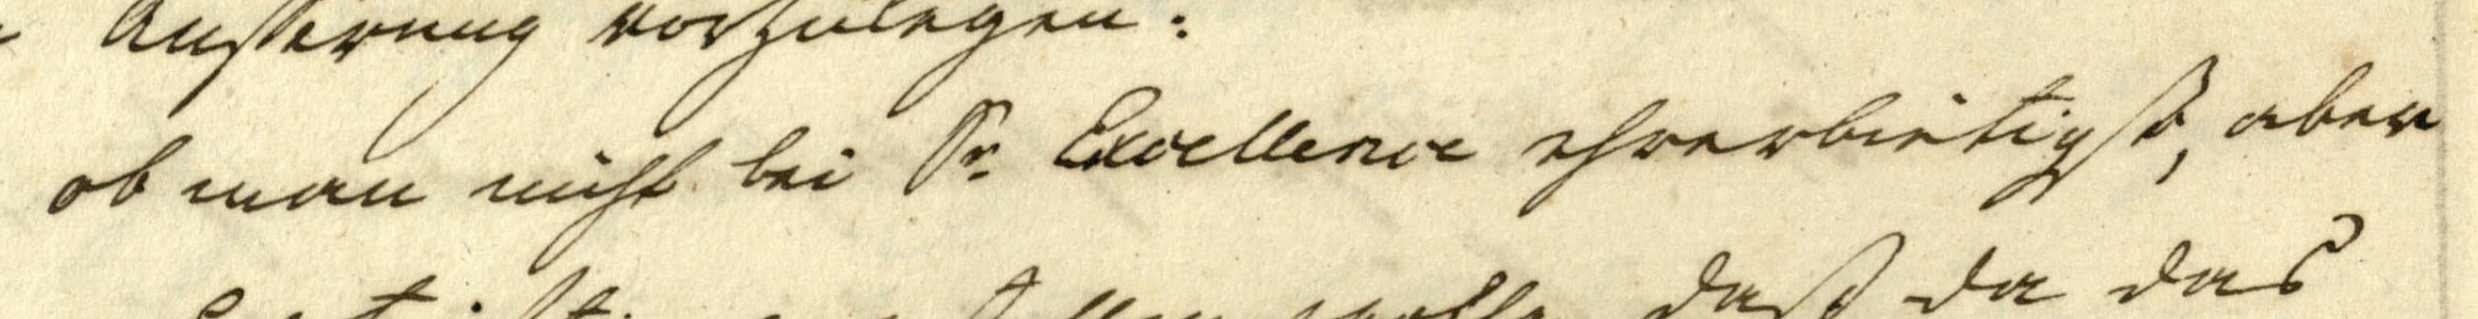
ob man nicht bei Sr Excellence ehrerbietigst, aber
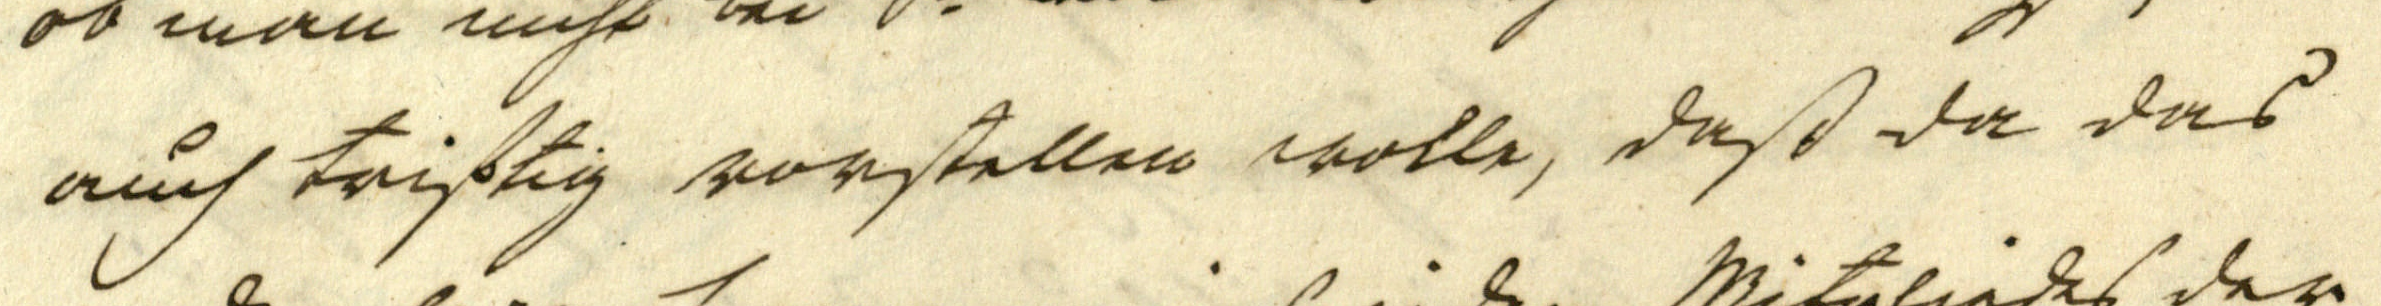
auch triftig vorstellen wolle, daß da das
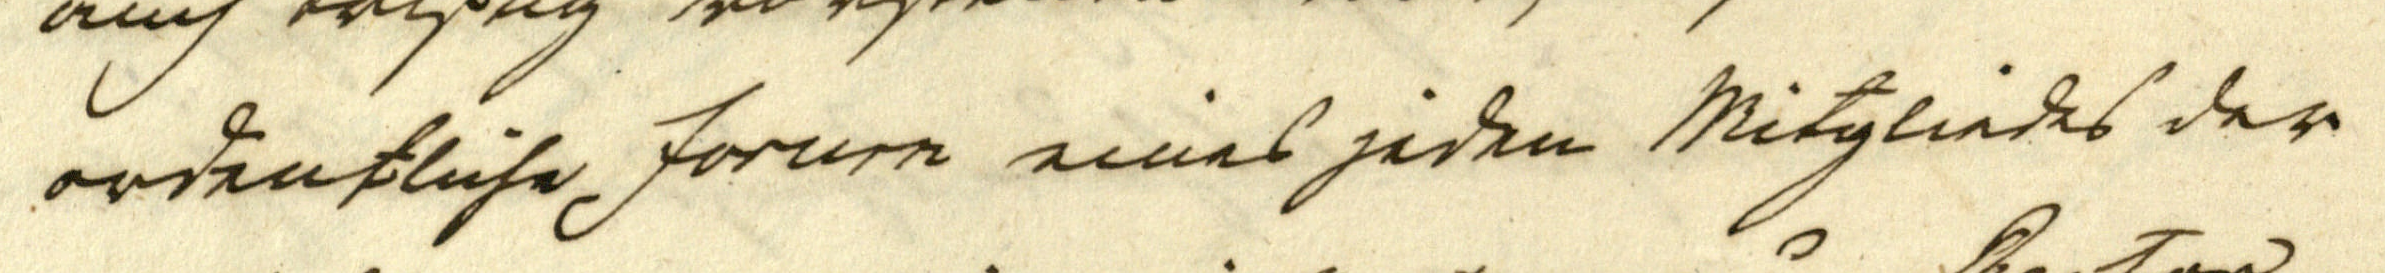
ordentliche Forum eines jeden Mitgliedes der
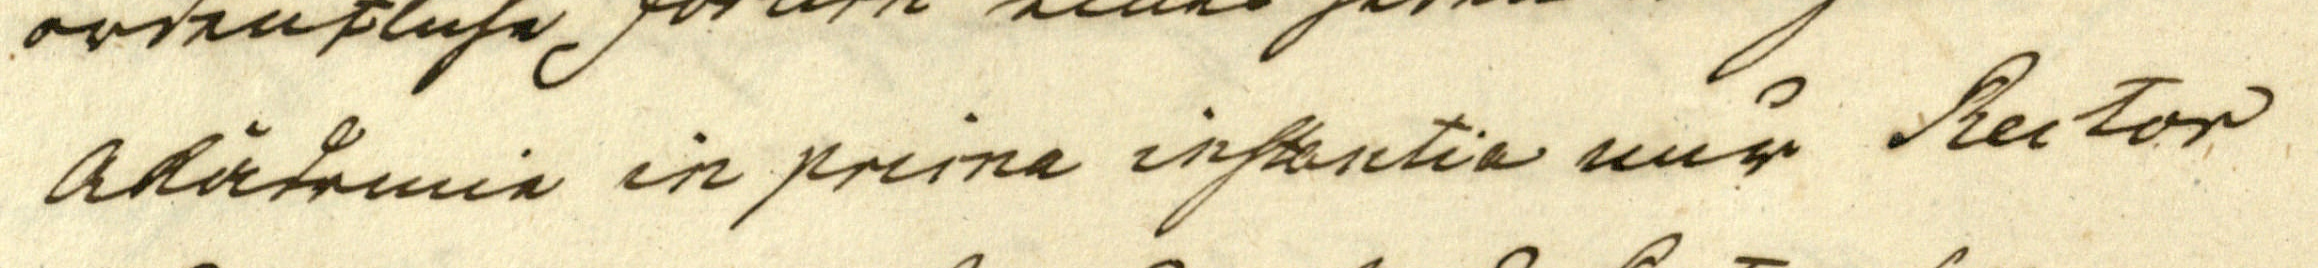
Akademie in prima instantia nur Rector
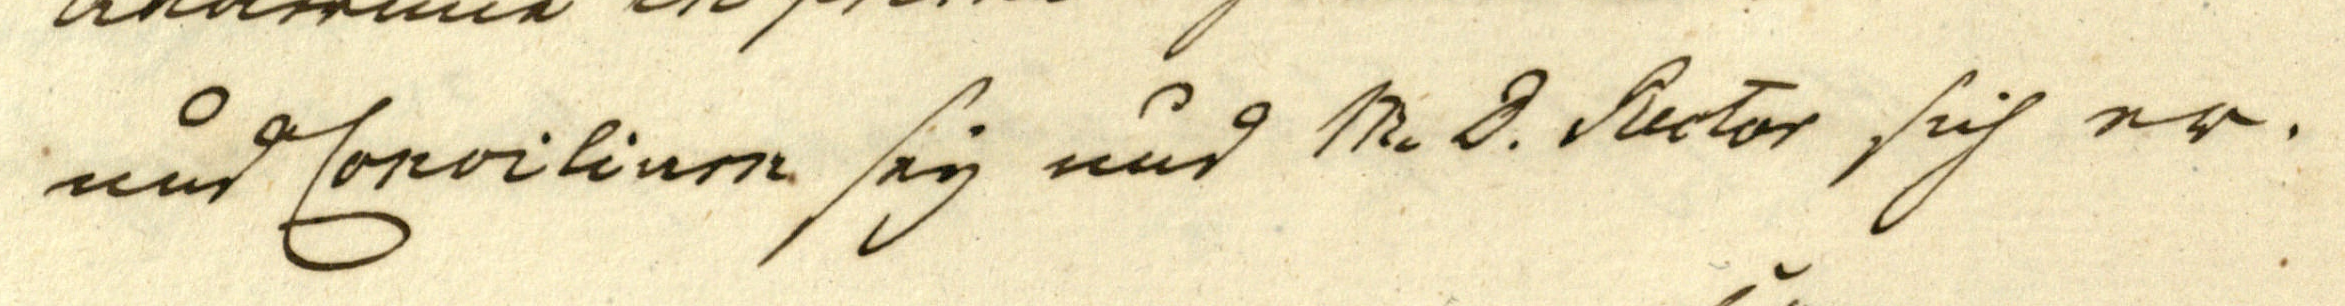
und Concilium seÿ und M. D. Rector sich er¬
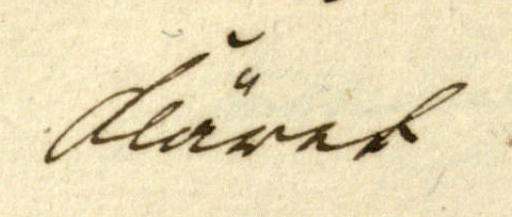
käret
